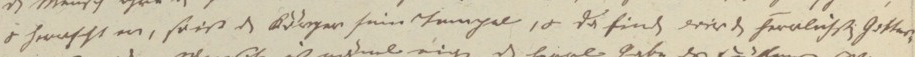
& herrscht er, so ist der Körper sein Tempel, & da finden wir den herrlichsten Gottes-
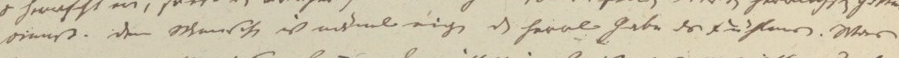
dienst. Dem Menschen ist näml. eigen die herrl. Gabe ds Fühlens. Was
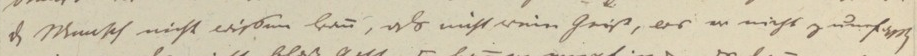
der Mensch nicht wissen kann, als nicht rein Geist, ws er nicht zu umfassen
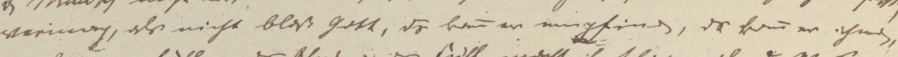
vermag, als nicht bloß Gott, ds kann er empfinden, ds kann er ahnden,
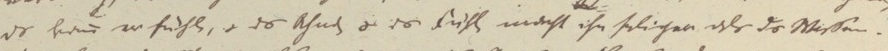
ds kann er fühlen, & ds Ahnden & ds Fühlen macht ihn seliger als ds Wissen.
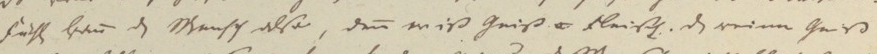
Fühlen kann der Mensch also, denn er ist Geist & Fleisch. Der reine Geist
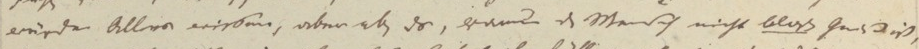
würde Alles wissen, aber eben ds, warum der Mensch nicht bloß Geist ist,
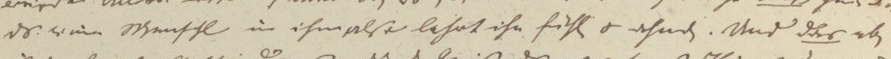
ds rein Menschl. in ihm also lehrt ihn fühlen & ahnden. Und das eben
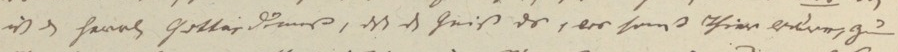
ist der herrl. Gottesdienst, dß der Geist ds, ws sonst Thier wäre, zum
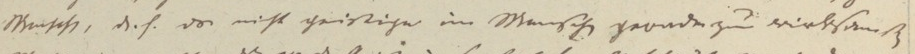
Menschen, d. h. ds nicht geistige im Menschen gerade zum wirksamsten
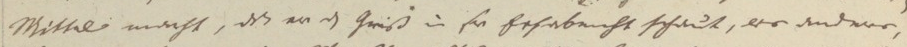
Mittel macht, dß er den Geist in sr Erhabenheit schaut, ws anders,
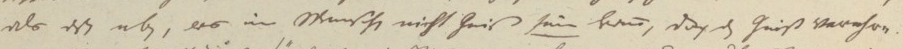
als dß eben, ws im Menschen nicht Geist sein kann, doch den Geist verehre.
